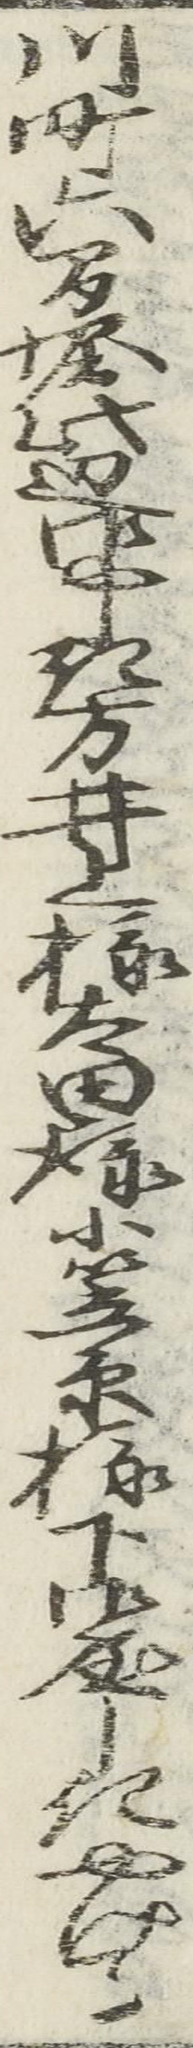川町六間堀此辺御やしき方井上様太田様小笠原様下御屋しきやける
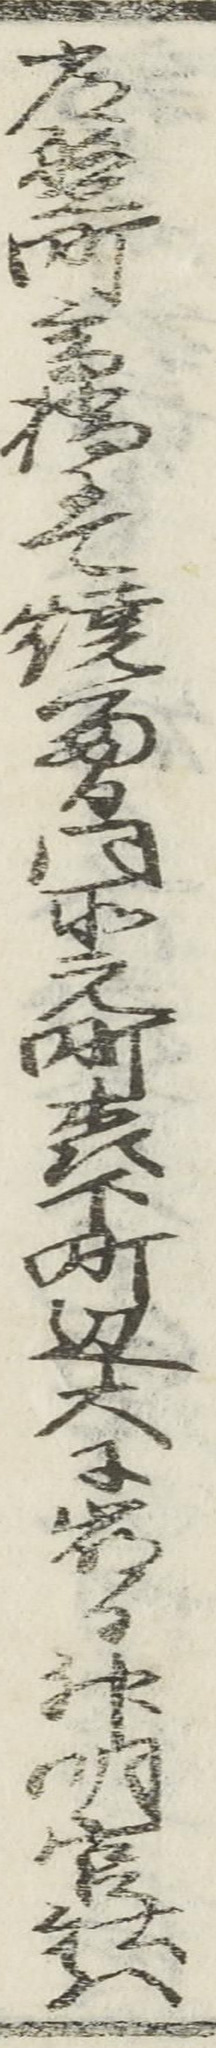常盤町高橋にて焼留る同所元町森下町辺大に崩る神明宮社は
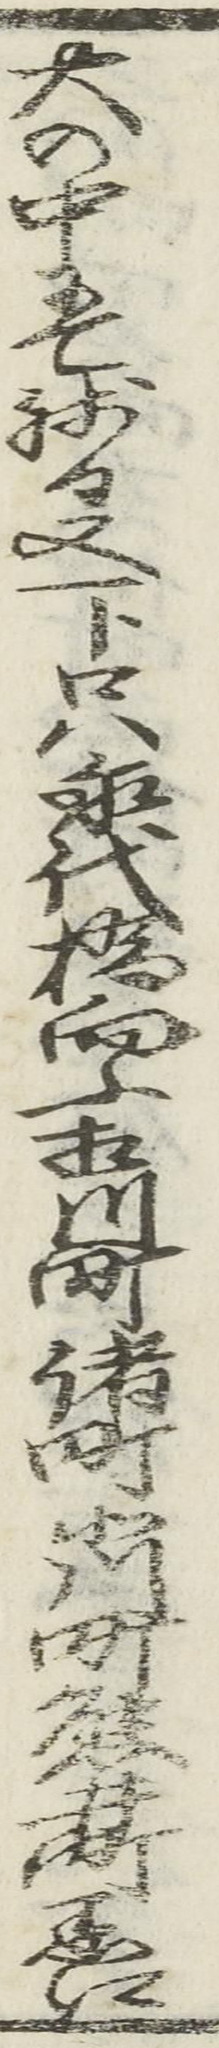大の中にて残る又下口は永代橋向ふ相川町偖町小川町熊井町愚江
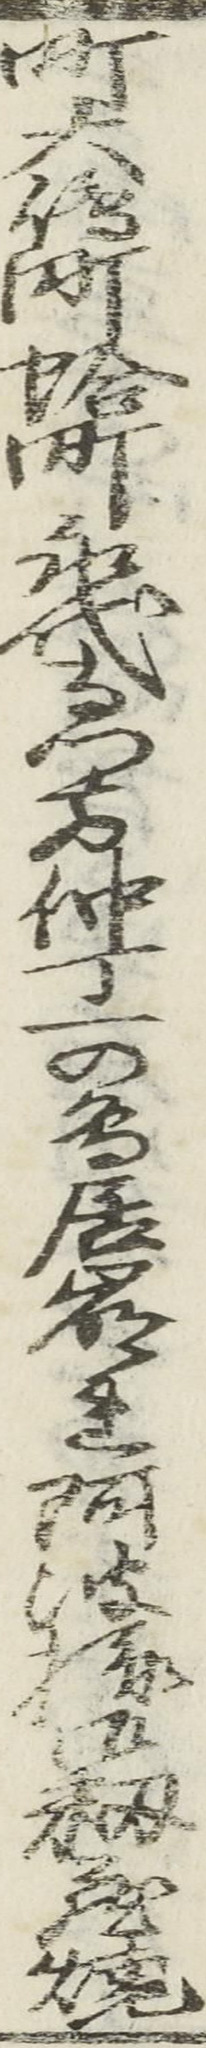町大伝町蛤町永代寺門前仲丁一の鳥居崩れ阿波様御籾蔵焼
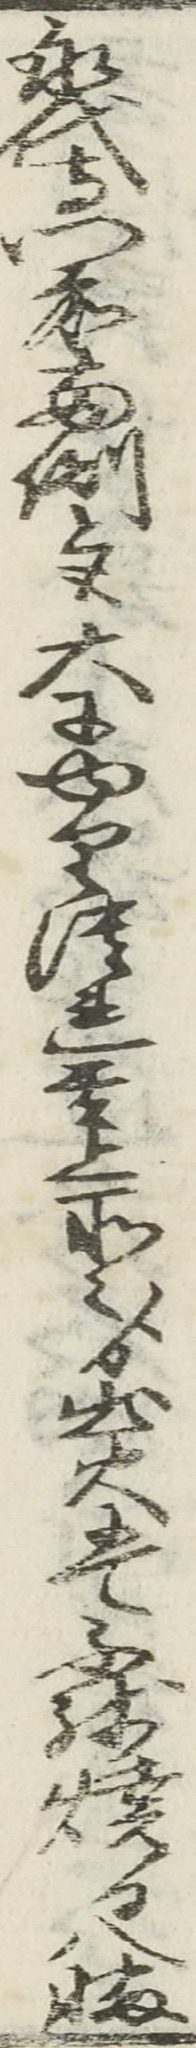永代寺門前両側とも大にゆり潰れ其上所ニゟ出火にて不残焼る八幡
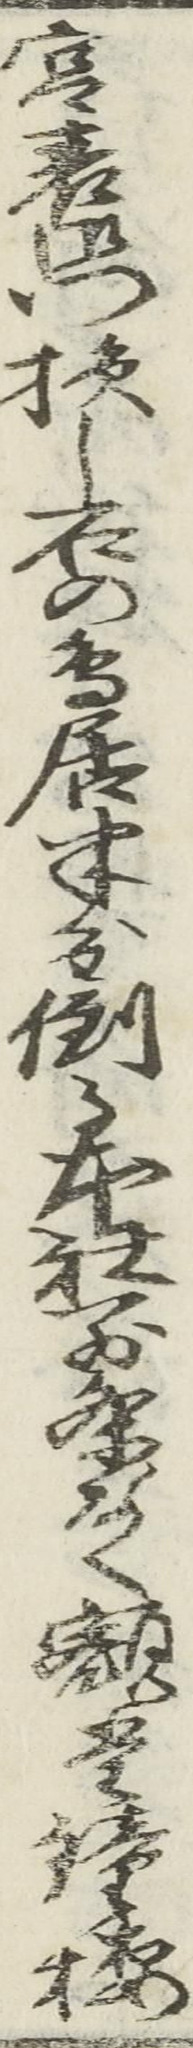宮表御門損し石の鳥居半分倒る本社別条なく額堂鐘楼
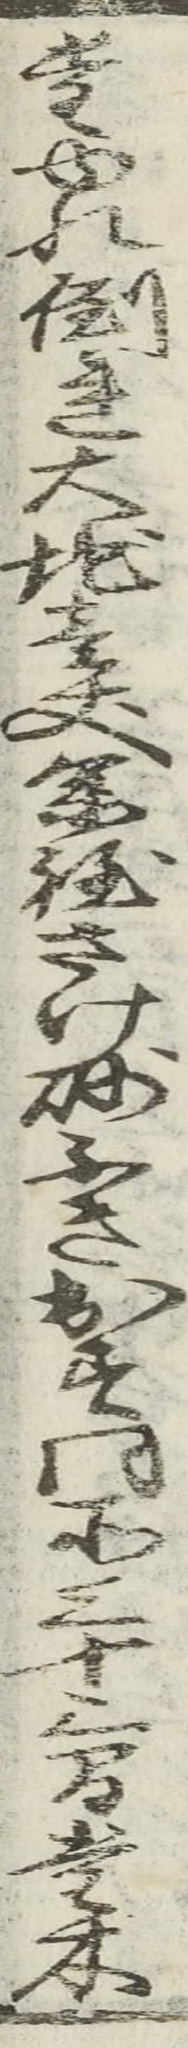堂ゆれ倒れ大地壱丈余程さけ砂ふき出す同所三十二間堂木
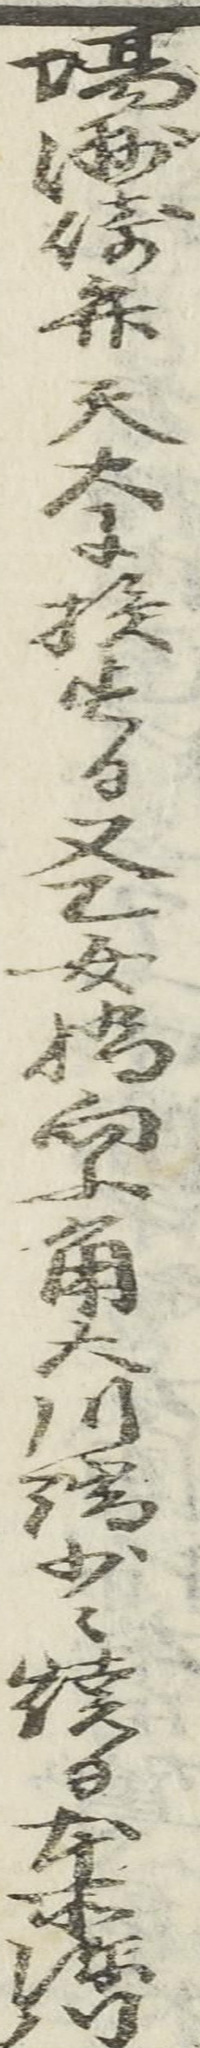場洲崎弁天大に損する又乙女橋向ふ角大川端少々焼る本木洲川
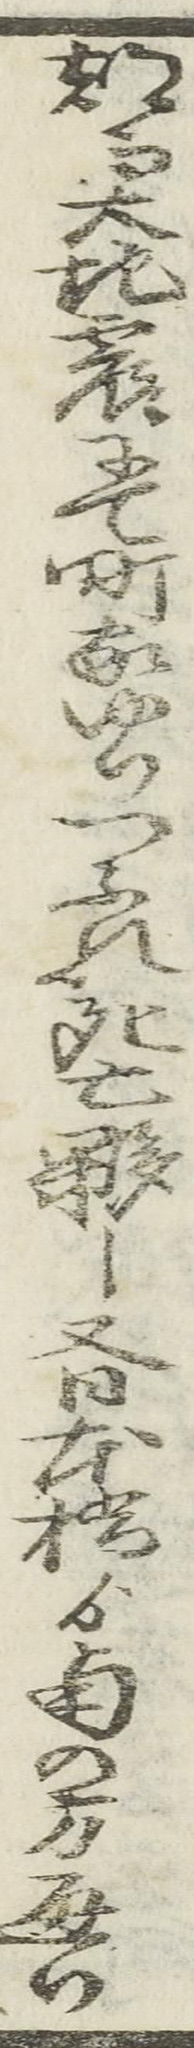部而大地震にて町家ゆりつふれ死亡夥し又日本橋ゟ南の方遍り
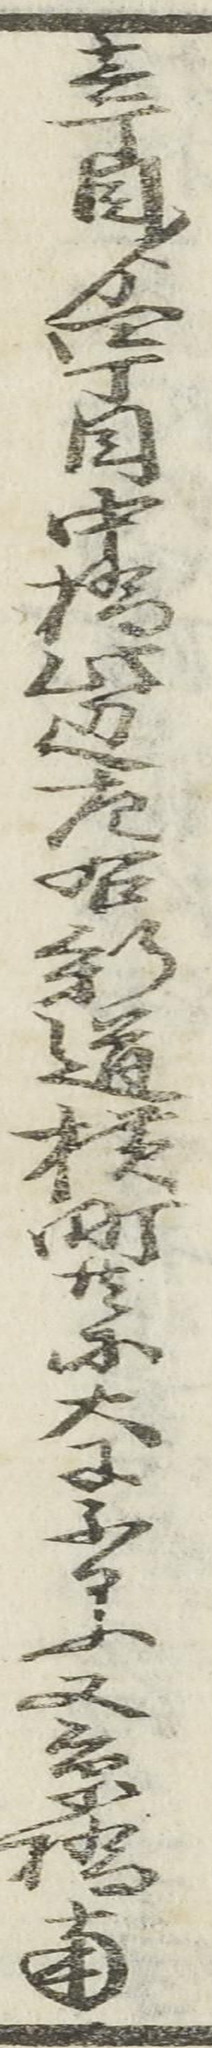壱丁目ゟ四丁目中橋此辺左右新道横町共に大にふるふ又京橋南
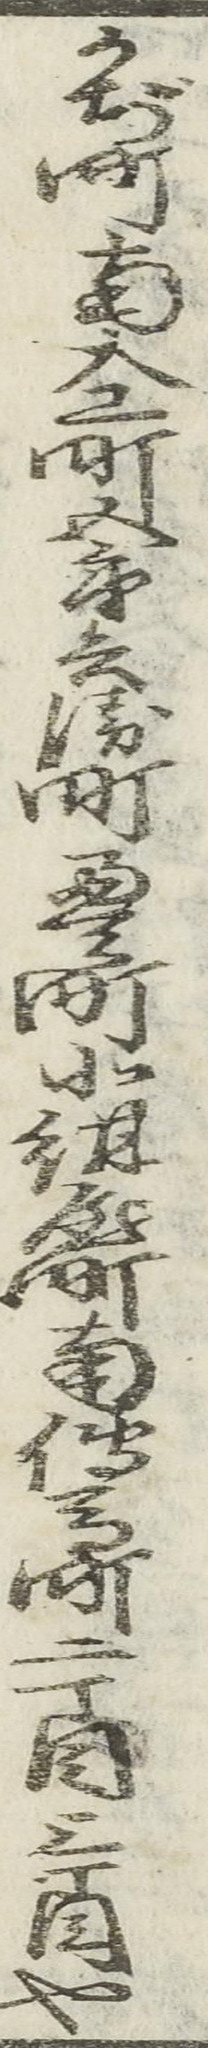かぢ町南大工町五郎兵衛町畳町北紺屋町南傳馬町二丁目三丁目や
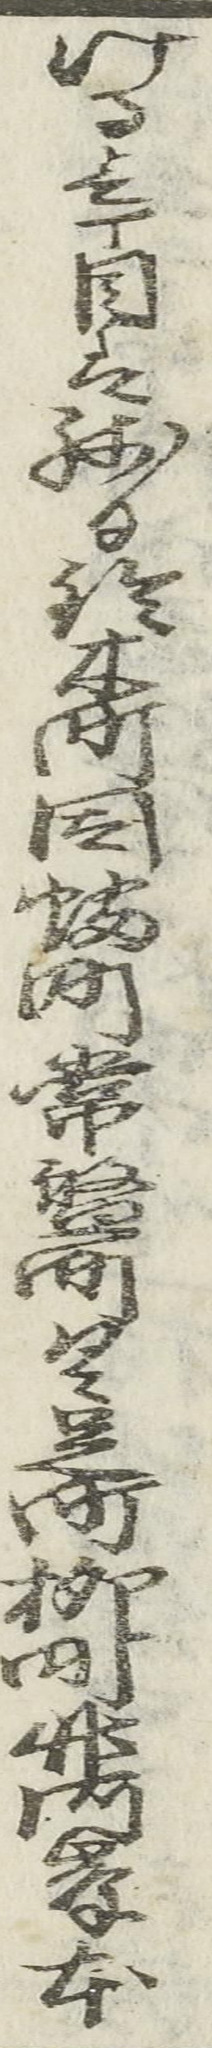ける壱丁目は残る撞木町因幡町常盤町具足町柳町此川岸本
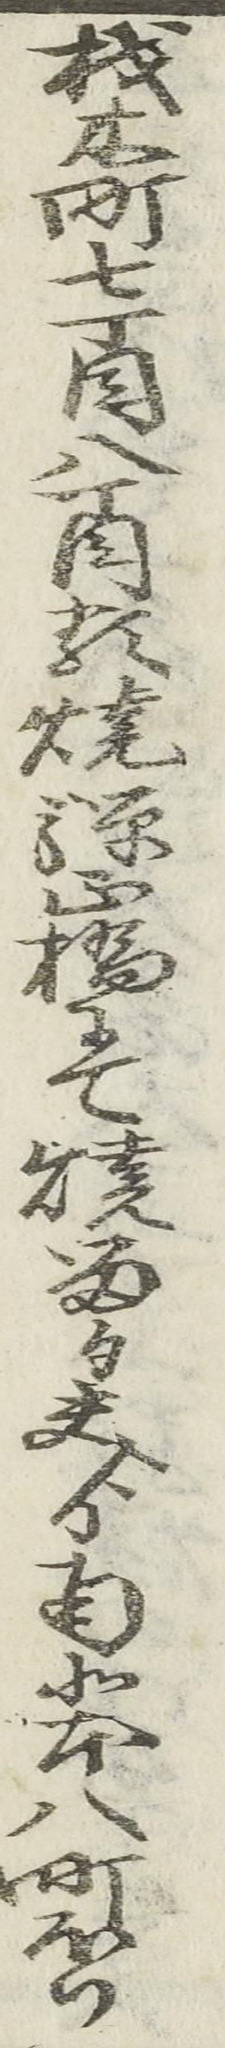材木町七丁目八丁目類焼弾正橋にて焼留る夫ゟ南北本八町ほり
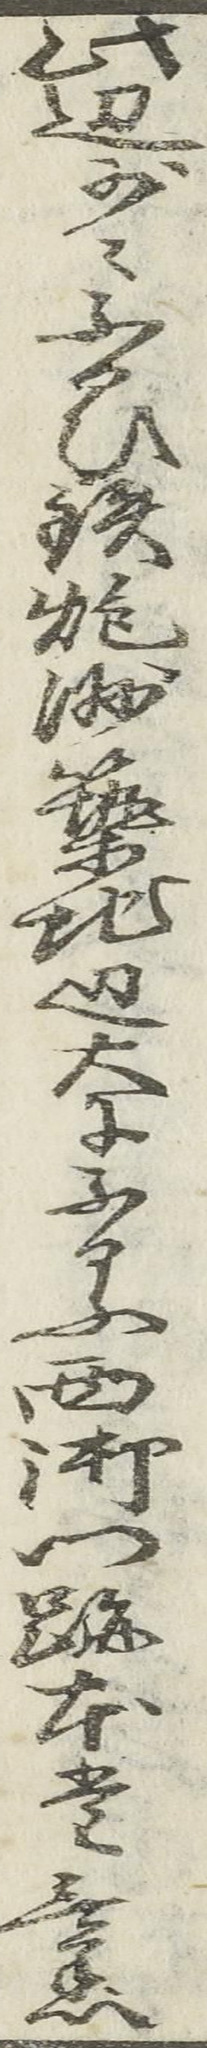此辺少〻ふるひ鉄砲洲築地辺大にふるふ西御門跡本堂無恙
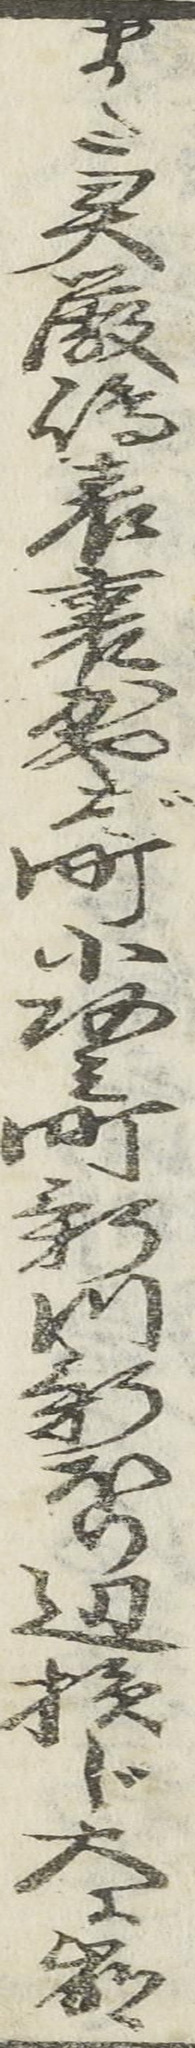また霊厳嶋表裏かやば町小あみ町新川新ほり辺損じ大に崩
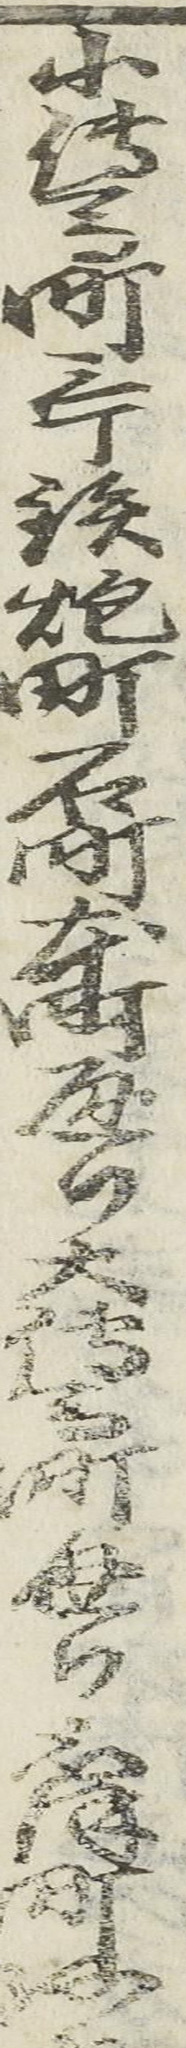小伝馬町三丁鉄炮町石町本町通り大伝馬町通り心津町跡右之外
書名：安政乙卯江戸大地震筆記　安政丙辰八月大阪大雷雨之記追加　安政三辰年七月松前辺大地震并八月大風雨記録
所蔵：東京大学地震研究所図書室 Earthquake Research Institute Library, The University of Tokyo, JAPAN
